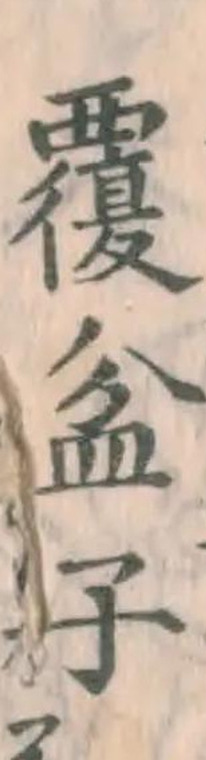覆盆子
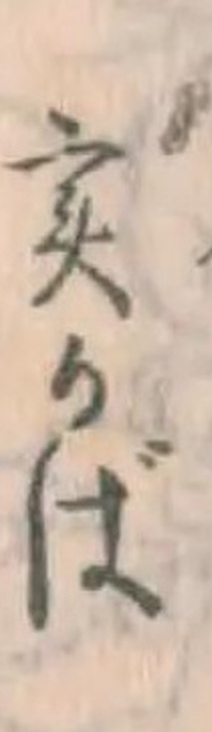実かば
